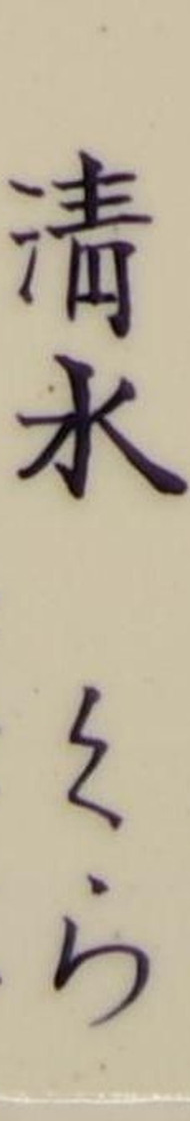清水くら
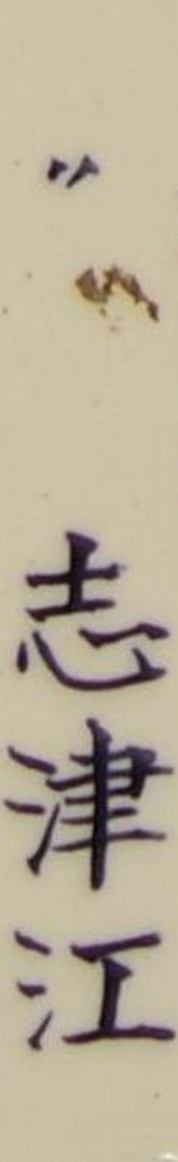志津江
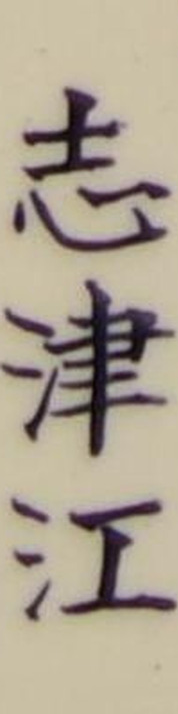志津江
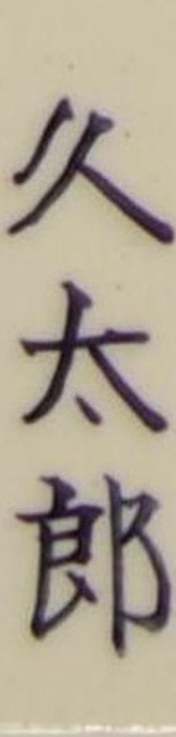久太郎
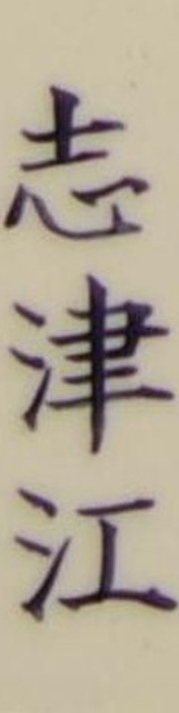志津江

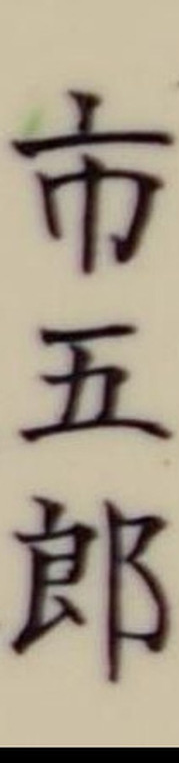市五郎
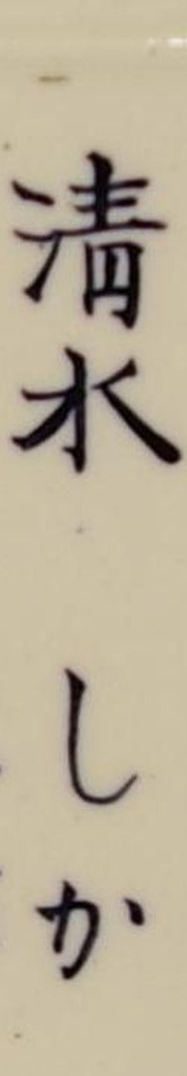清水しか
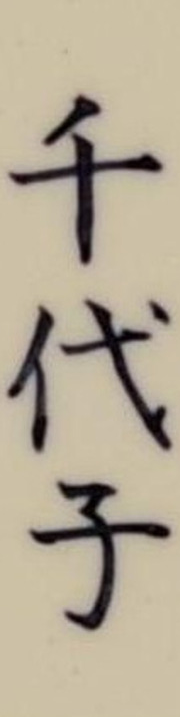千代子
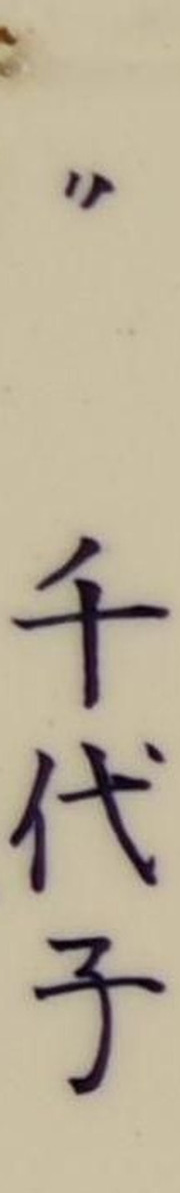千代子
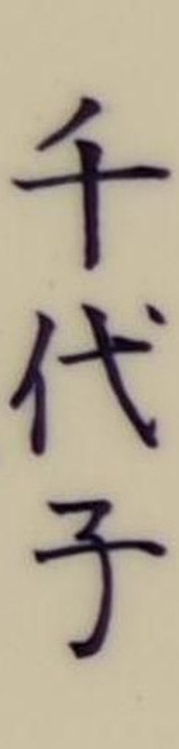千代子

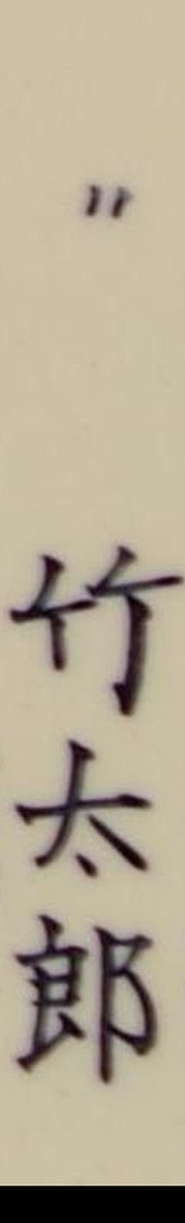竹太郎
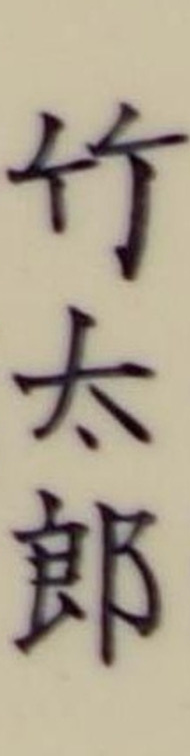竹太郎
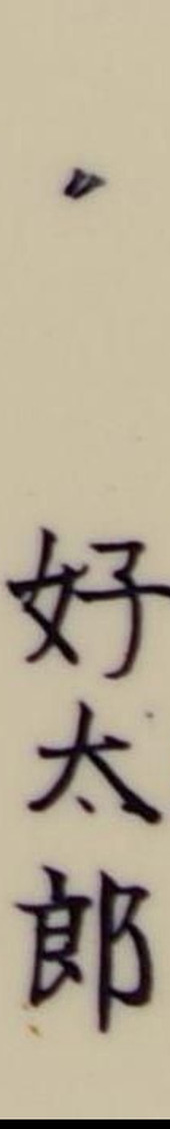好太郎
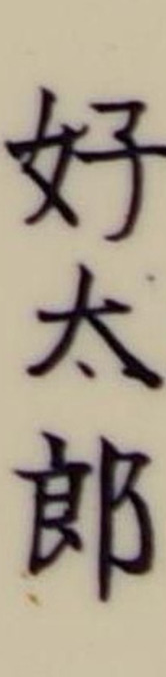好太郎
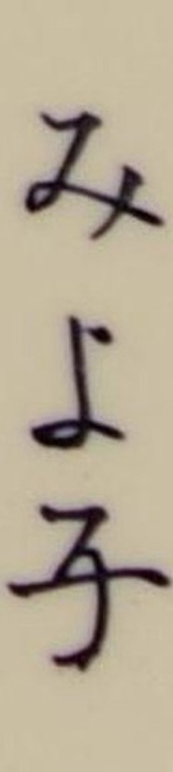みよ子
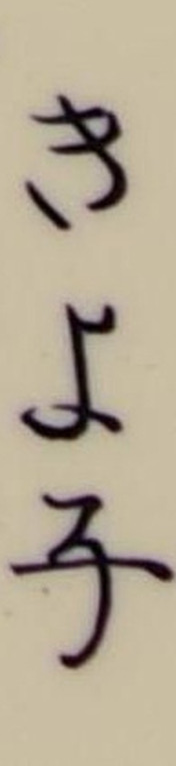きよ子
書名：E~L
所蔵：高野山金剛峯寺
